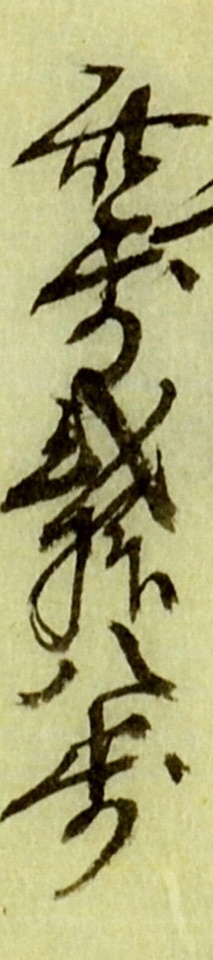此歩弐拾八歩
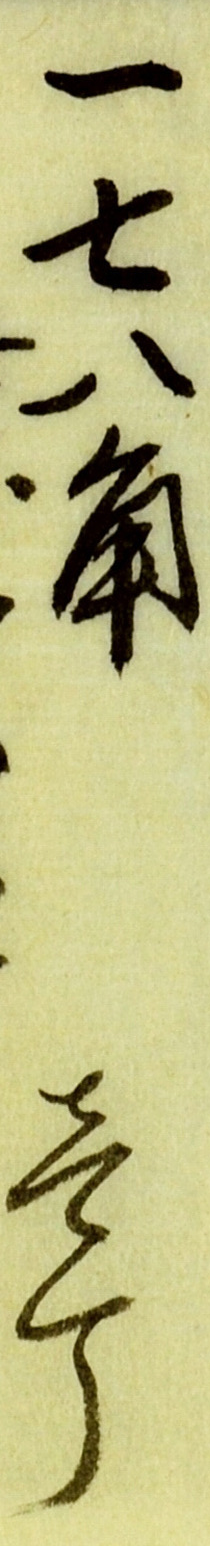一七八角壱丁
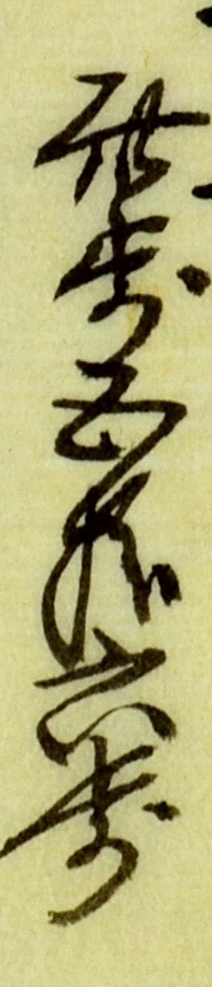此歩五拾六歩
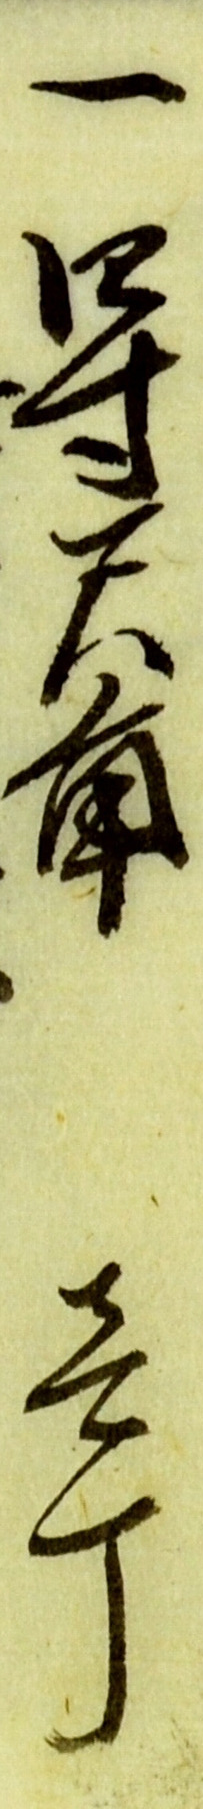一四寸尺角壱丁
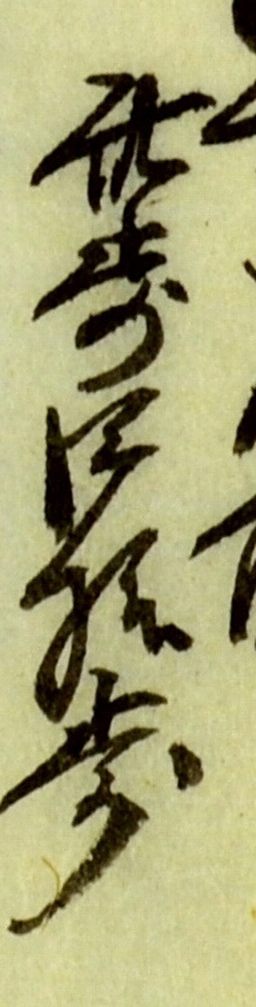此歩四拾歩

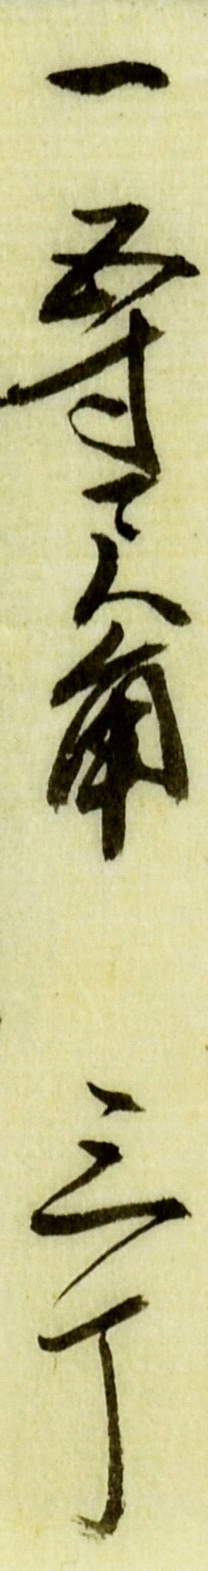一五寸尺角三丁
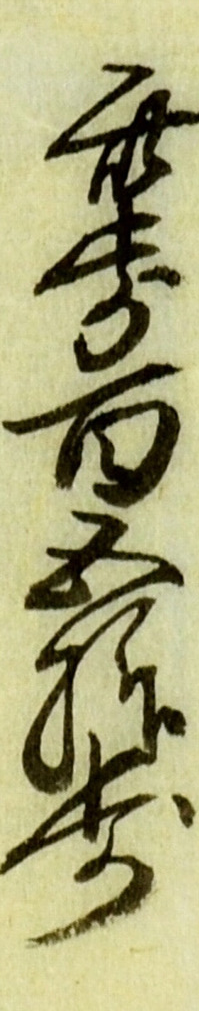此歩百五拾歩
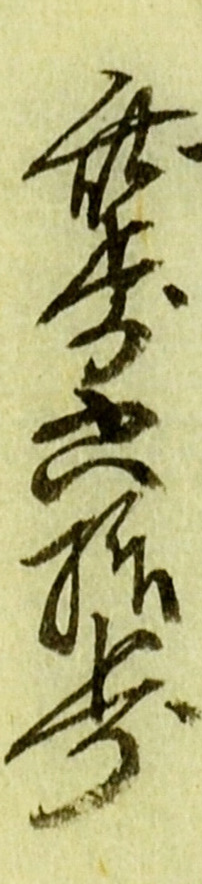此歩六拾歩
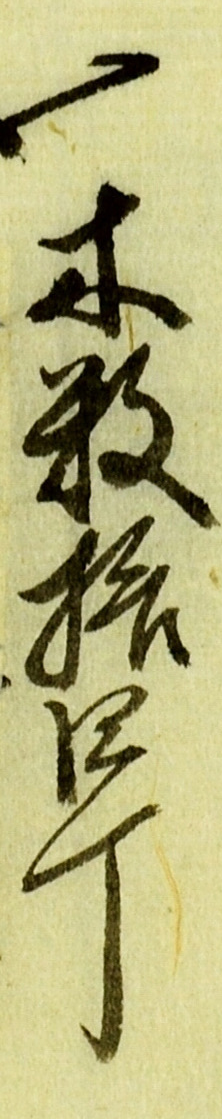木数拾四丁
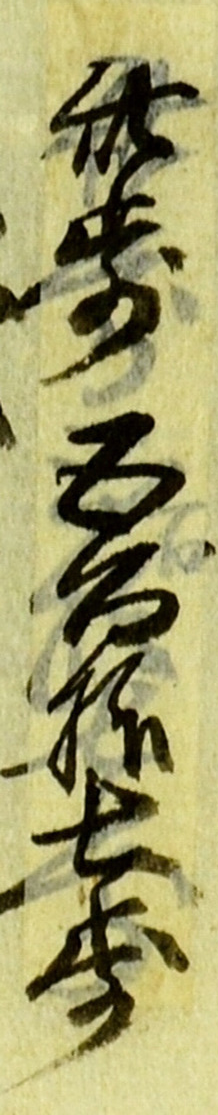〆此歩五百拾七歩
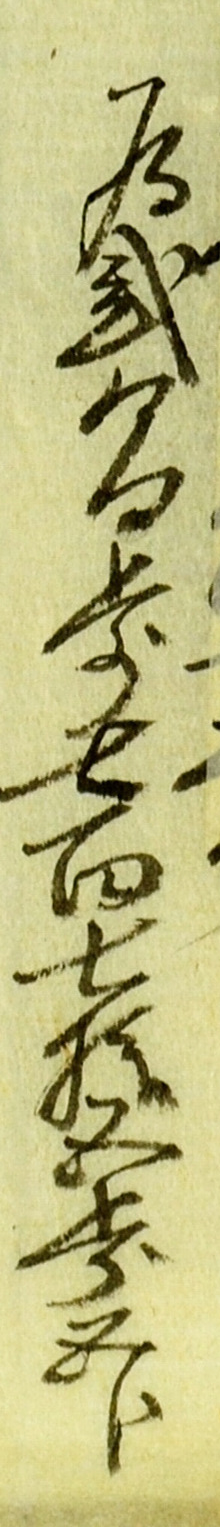為弐間歩七百七拾五歩五分
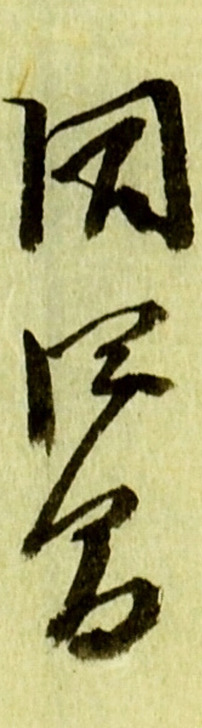同四間
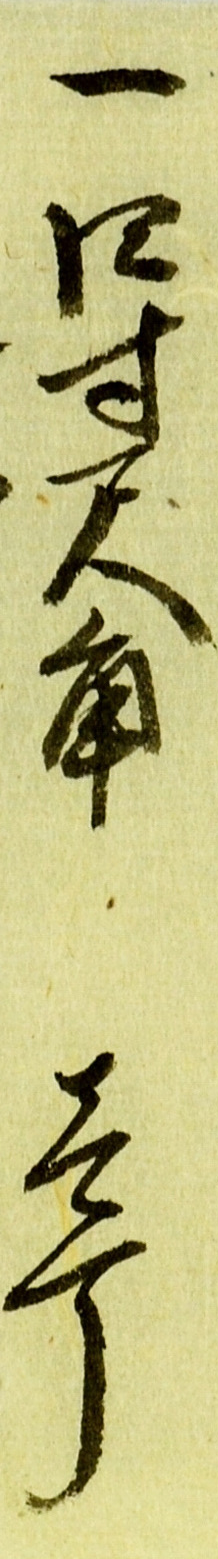一四寸尺角壱丁
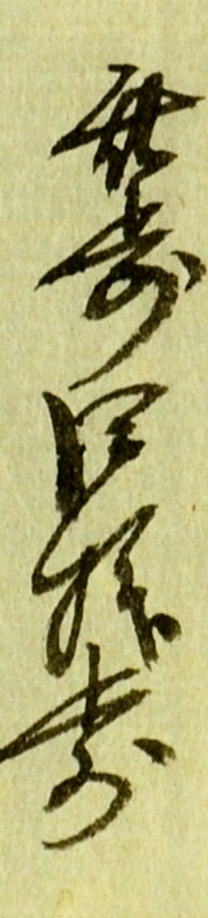此歩四拾歩
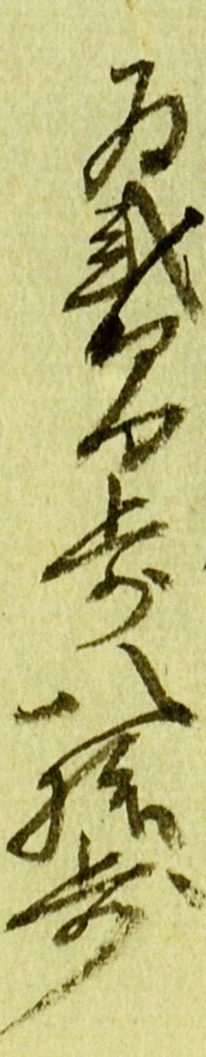為弐間歩八拾歩
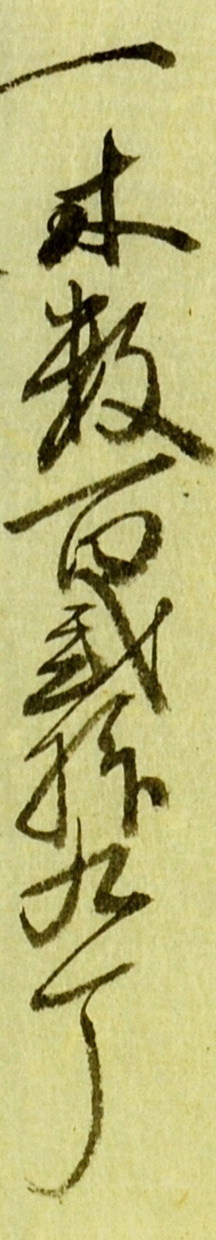木数百弐拾九丁
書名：材木川下ケ分一上納帳
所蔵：伊那市立高遠町図書館・合同会社AMANE
